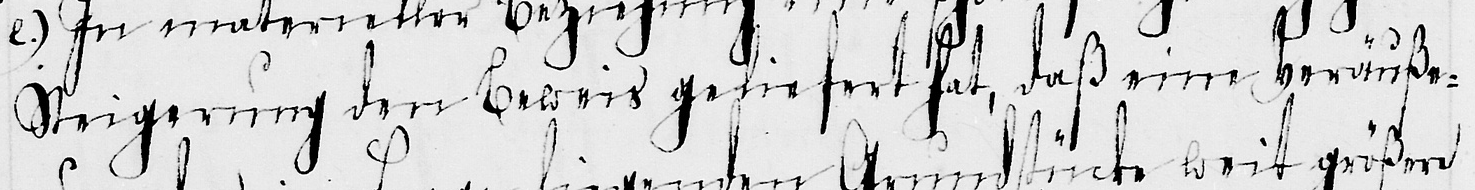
Steigerung den Beweis geliefert hat, daß eine Veräuße¬
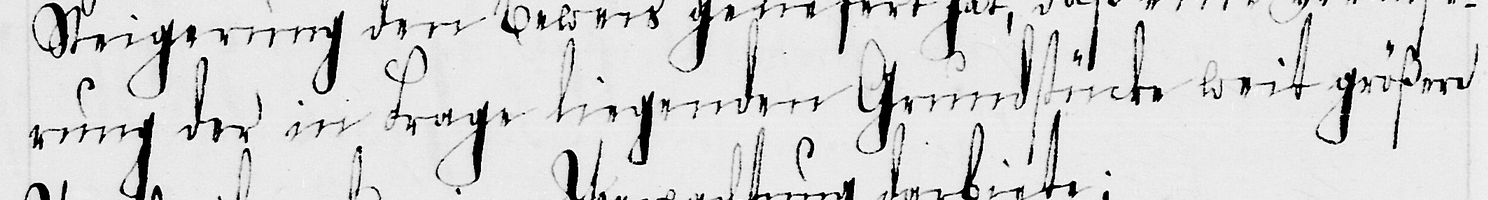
rung der in Frage liegenden Grundstücke weit größere
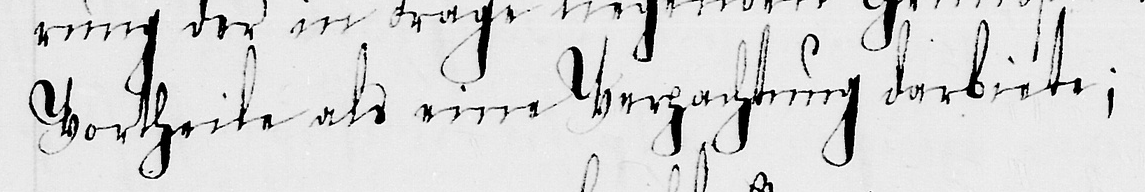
Vortheile als eine Verpachtung darbiete;
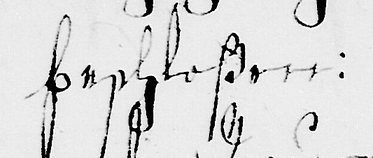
beschloßen:
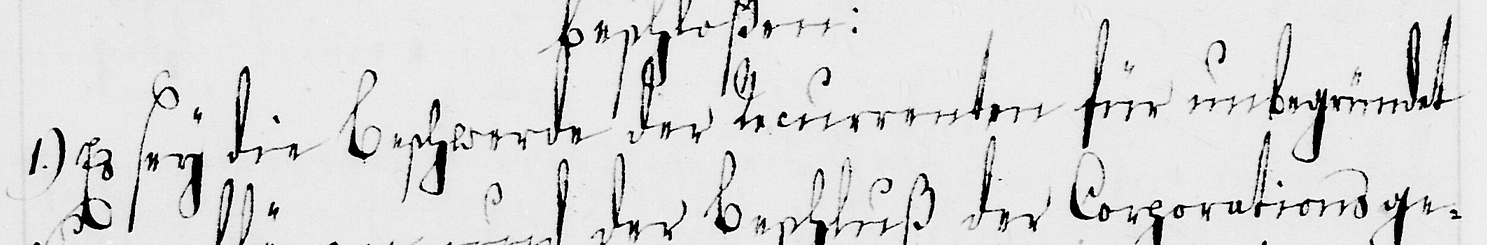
Es sey die Beschwerde der Recurrenten für unbegründet
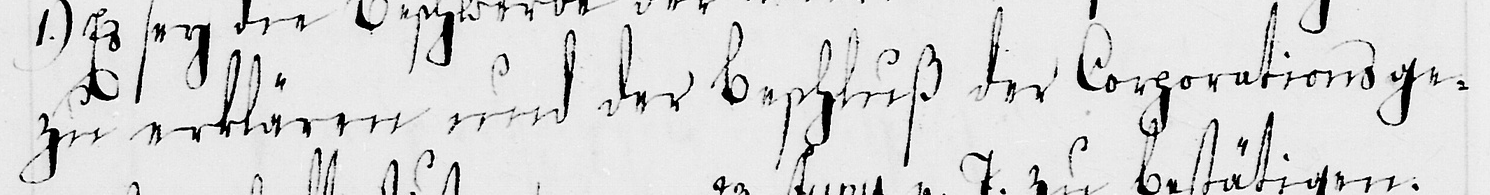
zu erklären und der Beschluß der Corporationsge¬
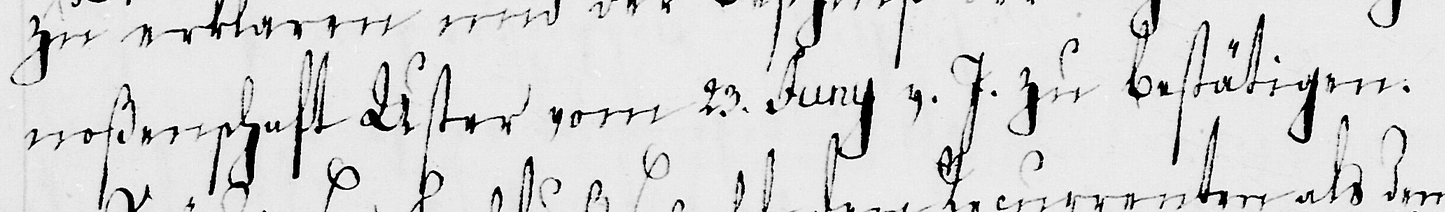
noßenschaft Uster vom 23. Juny v. J. zu bestätigen.
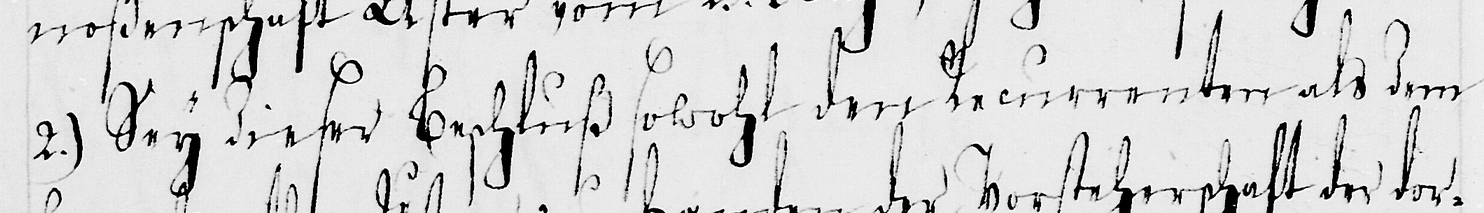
2.) Sey dieser Beschluß sowohl den Recurrenten als dem
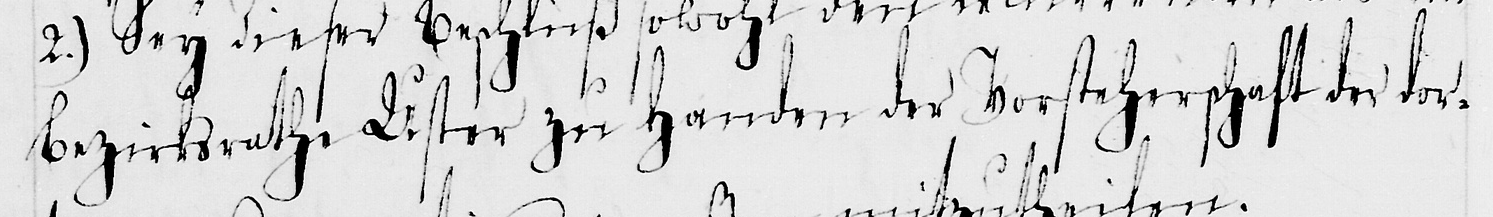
Bezirksrathe Uster zu Handen der Vorsteherschaft der dor¬
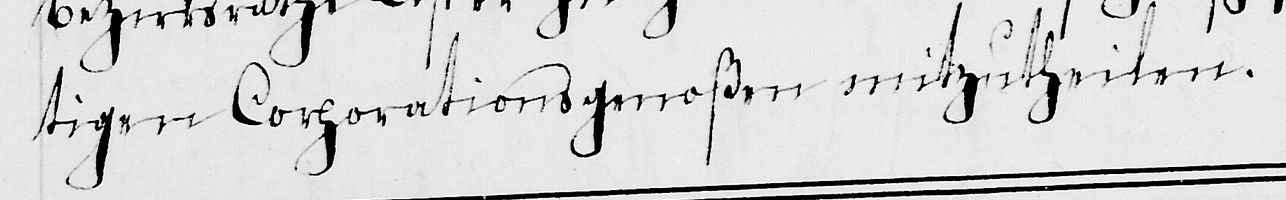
tigen Corporationsgenoßen mitzutheilen.
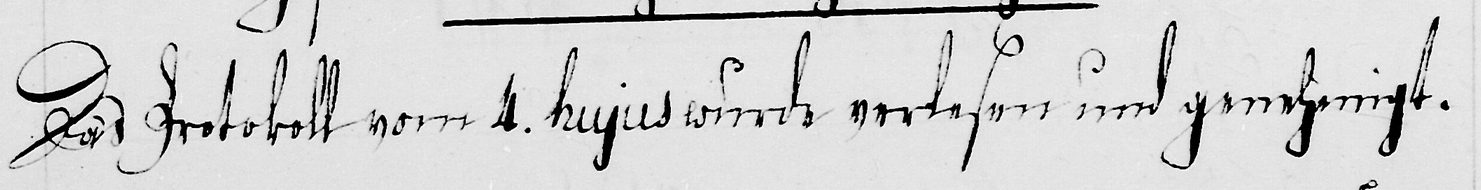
Das Protokoll vom 4. hujus wurde verlesen und genehmigt.
